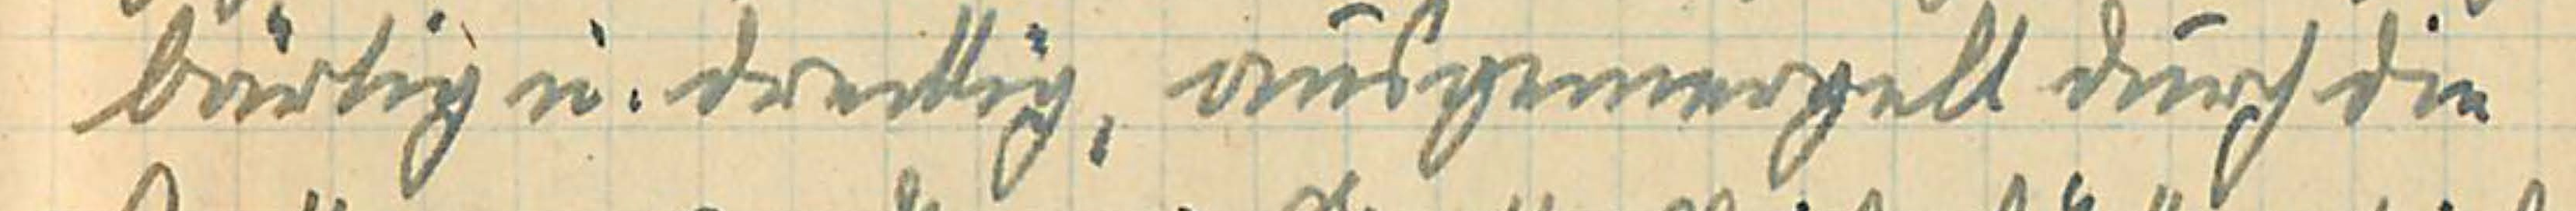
bärtig u. dreckig, ausgemergelt durch die
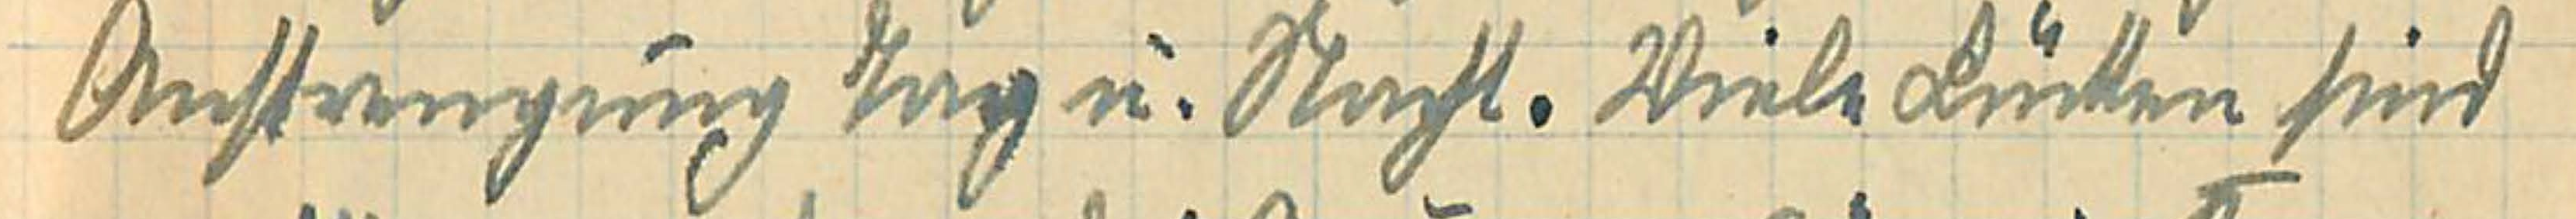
Anstrengung Tag u. Nacht. Viele Lücken sind
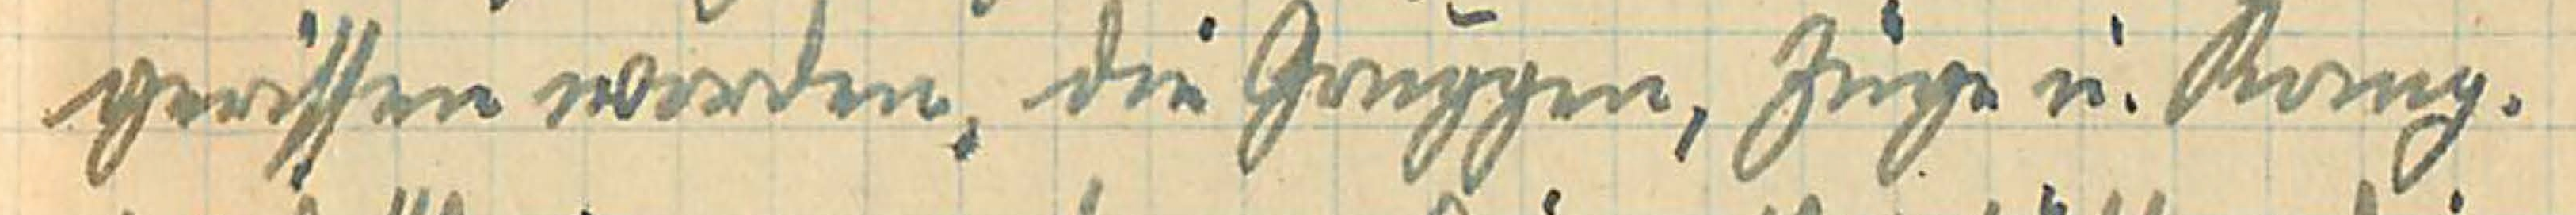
gerissen worden. Die Gruppen, Züge u. Komp.
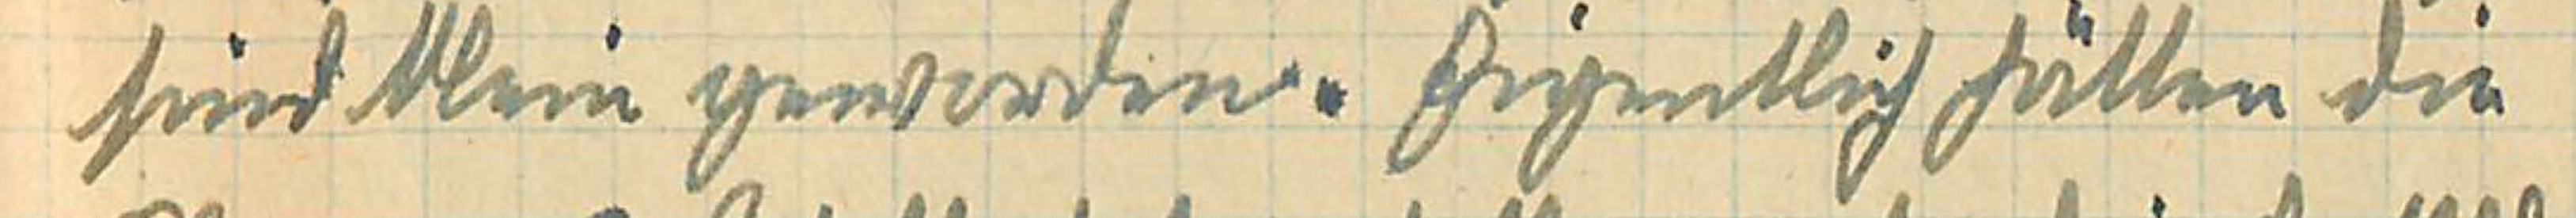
sind klein geworden. Eigentlich hätten die
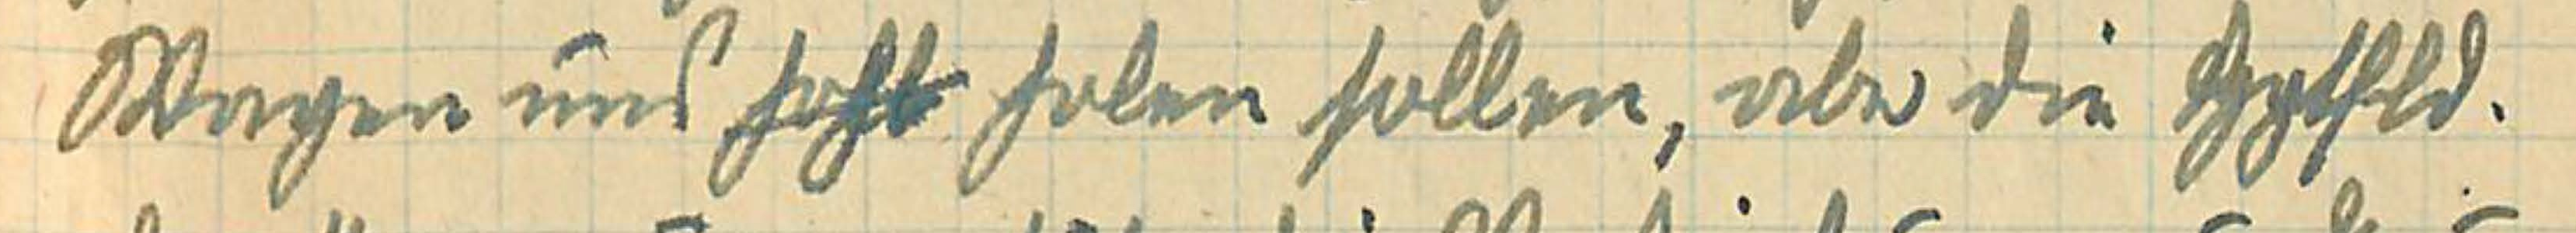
Wagen uns hohl holen sollen, aber die Hptfld.
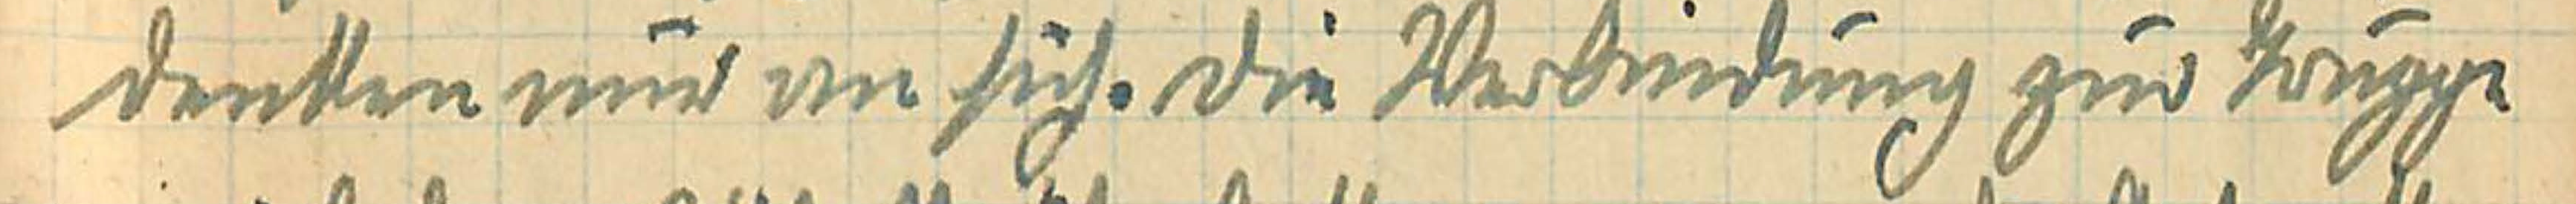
denken nur an sich. Die Verbindung zur Truppe
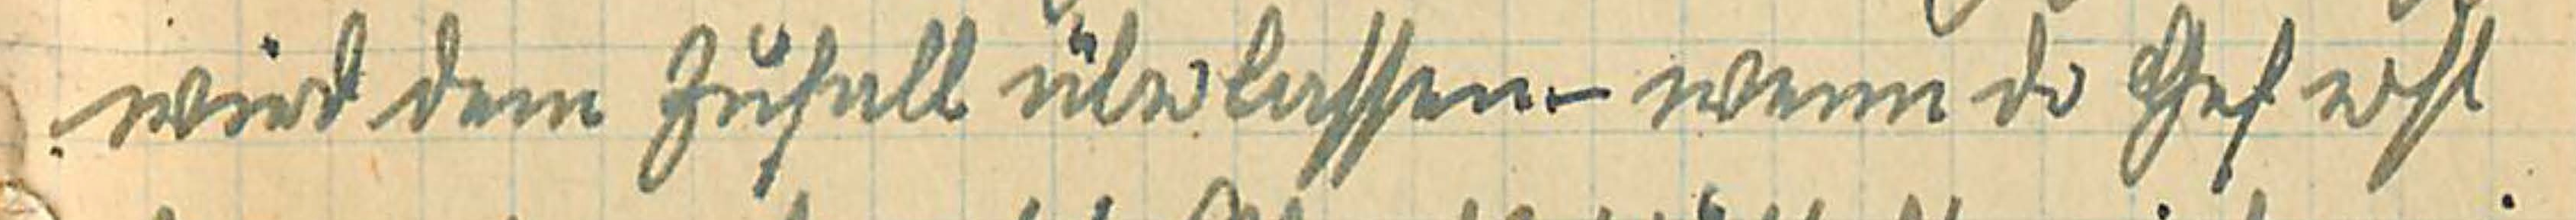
wird dem Zufall überlassen – wenn der Chef erst
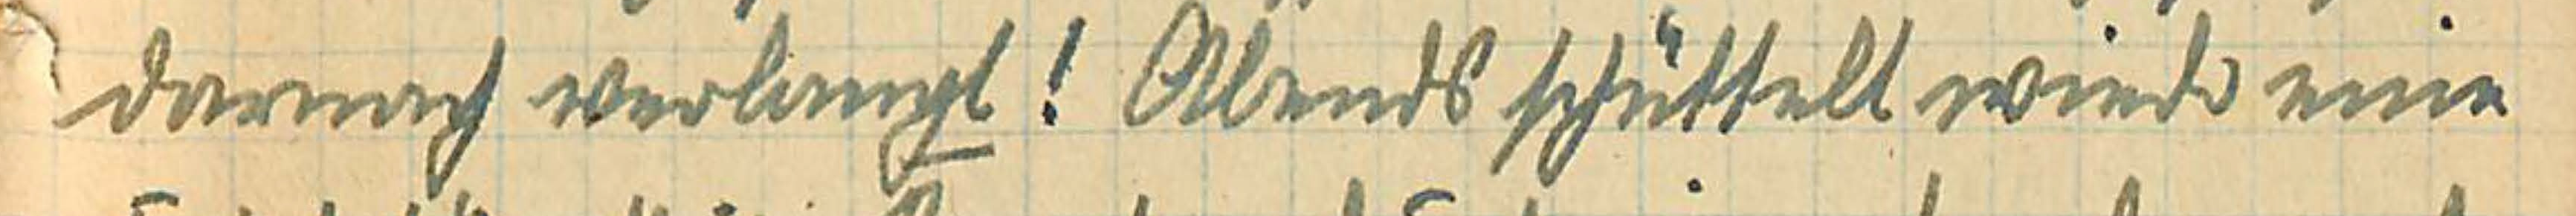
darnach verlangt! Abends schüttelt wieder eine
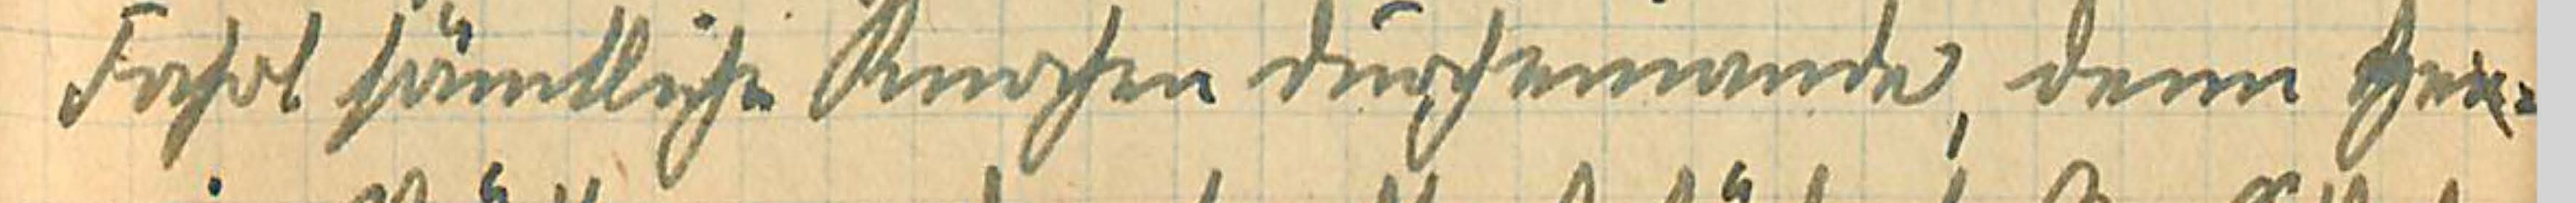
Fahrt sämtliche Knochen durcheinander, denn Her-
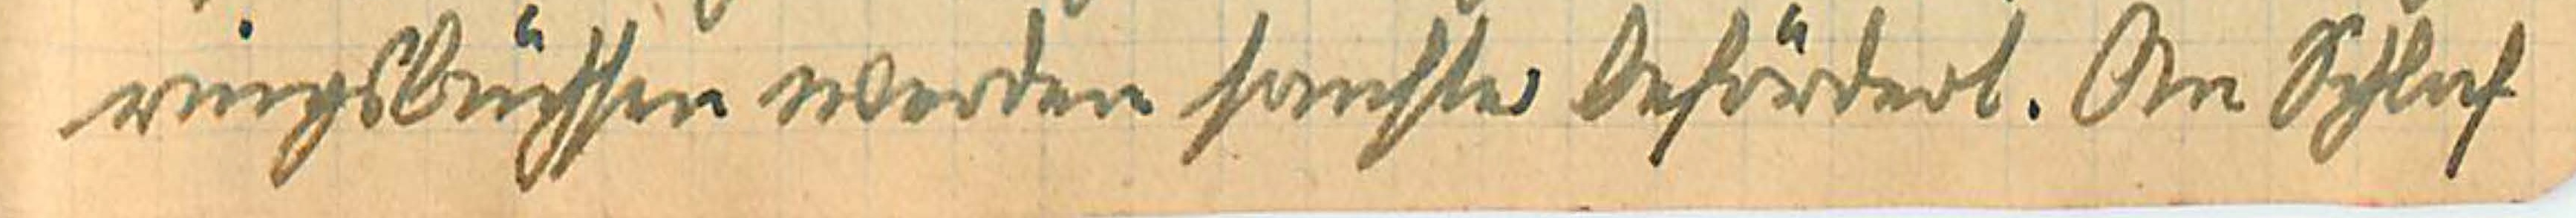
ringsbüchsen werden sanfter befördert. An Schlaf
